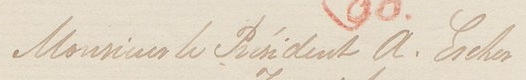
Monsieur le Président A. Escher
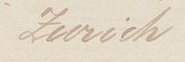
Zurich
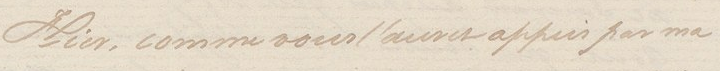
Hier, comme vous l'aurez appris par ma
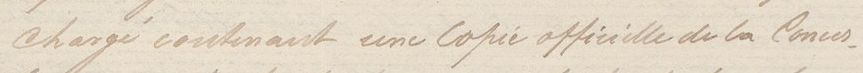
chargé contenant une Copie officielle de la Conces-
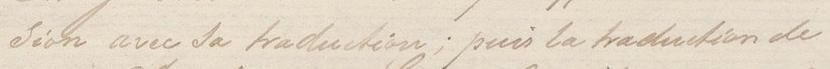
sion avec sa traduction; puis la traduction de
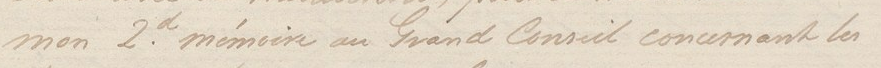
mon 2d mémoire au Grand Conseil concernant les
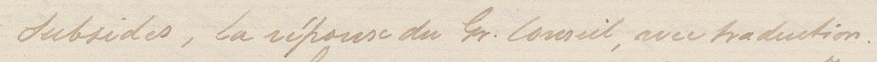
subsides, la réponse du Gr. Conseil, avec traduction.
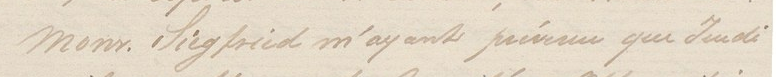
Mons. Siegfried m'ayant prévenu que Jeudi
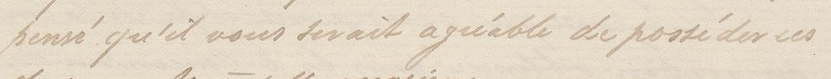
pensé qu'il vous serait agréable de posséder ces
